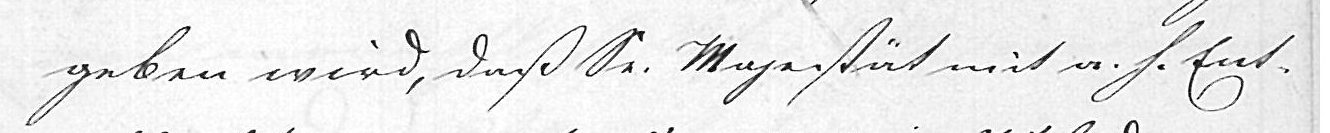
geben wird, daß Sr. Majestät mit a.h. Ent-
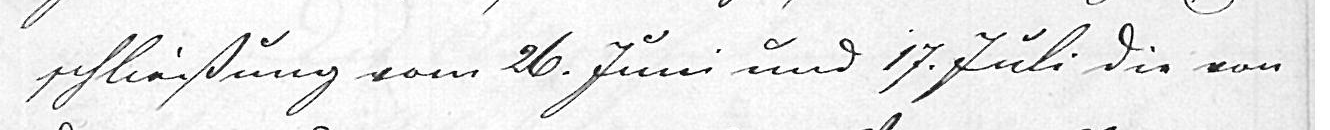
schließung vom 26. Juni und 17. Juli die von
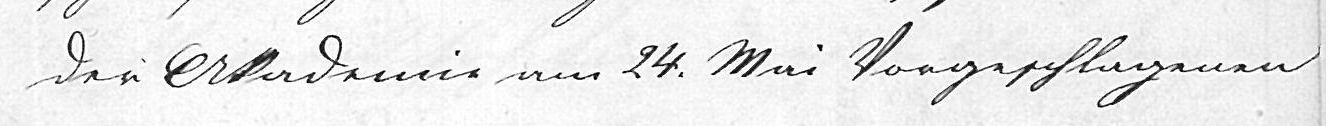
der Akademie am 24. Mai Vorgeschlagenen
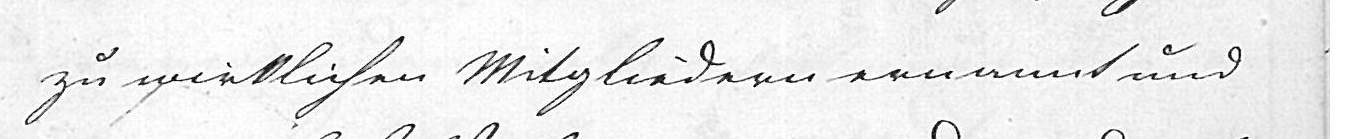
zu wirklichen Mitgliedern ernannt und
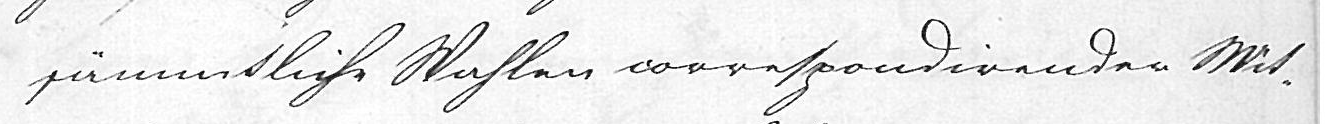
sämmtliche Wahlen correspondirender Mit-
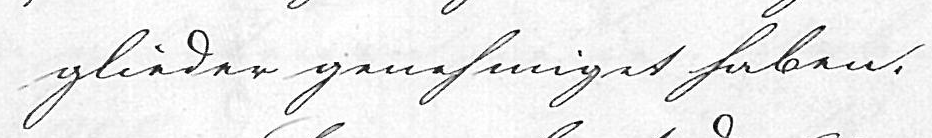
glieder genehmiget haben.
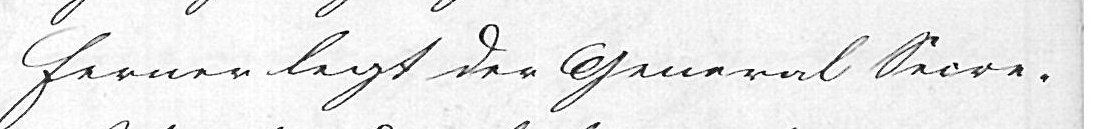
Ferner legt der General Secre-
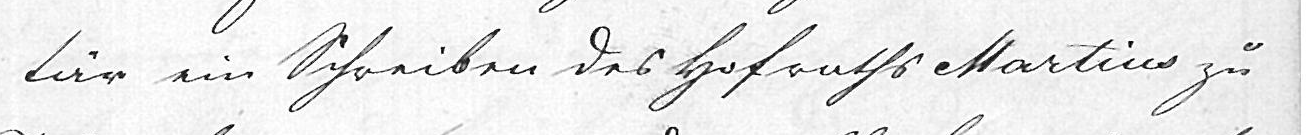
tär ein Schreiben des Hofraths Martius zu
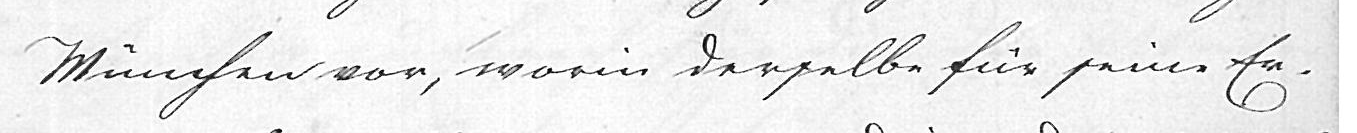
München vor, worin derselbe für seine Er
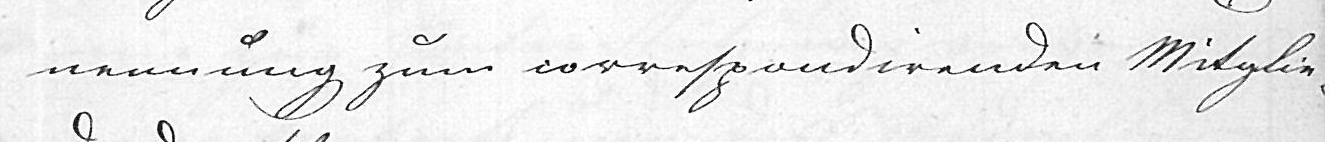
nennung zum correspondirenden Mitglie-
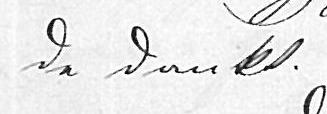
de dankt.
